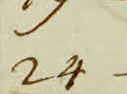24
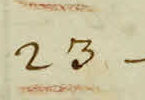23
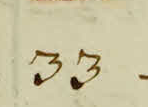33
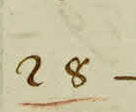28
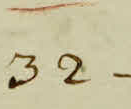32
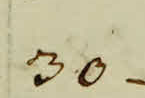30
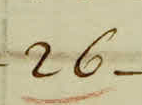26
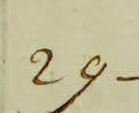29
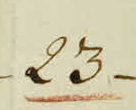23
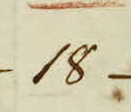18
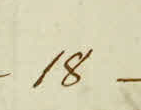18
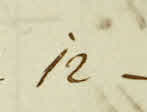12
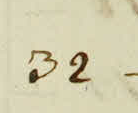32
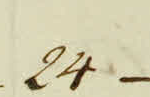24
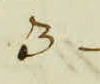3
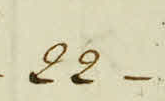22
